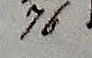76
